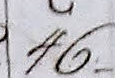46
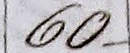60
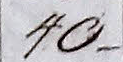40
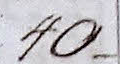40
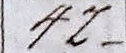42
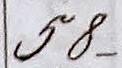58
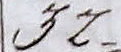32
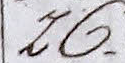26
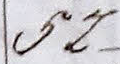52
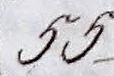55
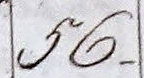56
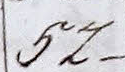52
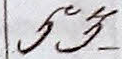53
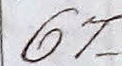67
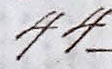44
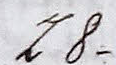28
